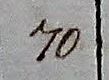70
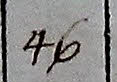46
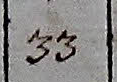33
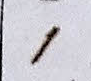1
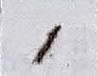1
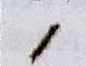1
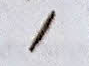1
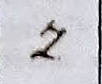2
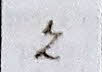2
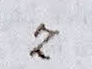2
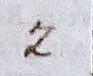2
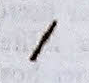1
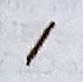1
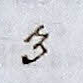3
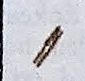1
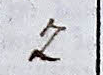2
